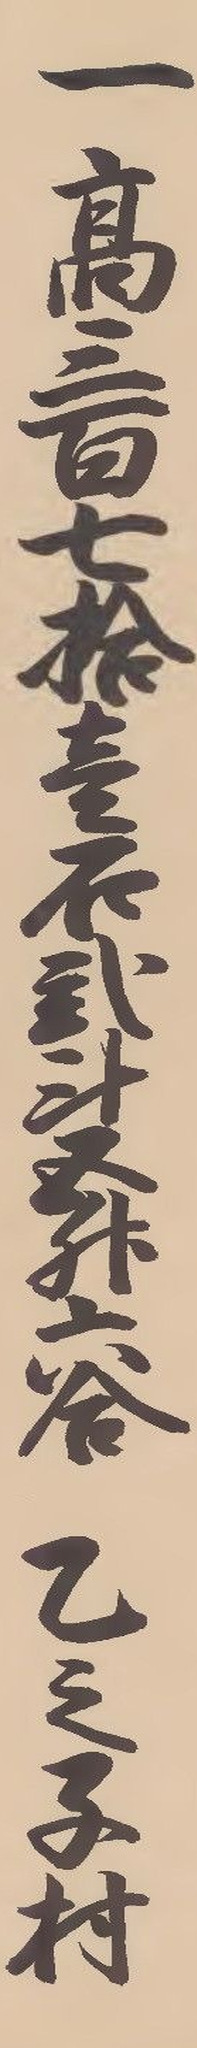一高三百七拾壱石弐斗五升六合乙之子村
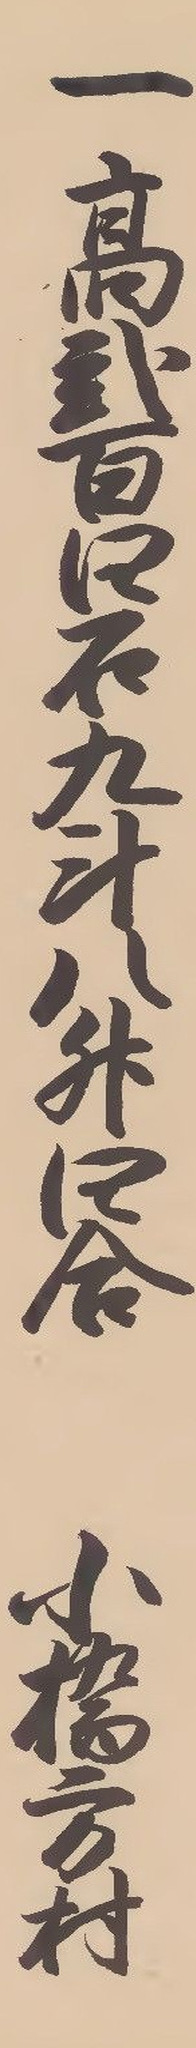一高弐百四石九斗八升四合小橋方村
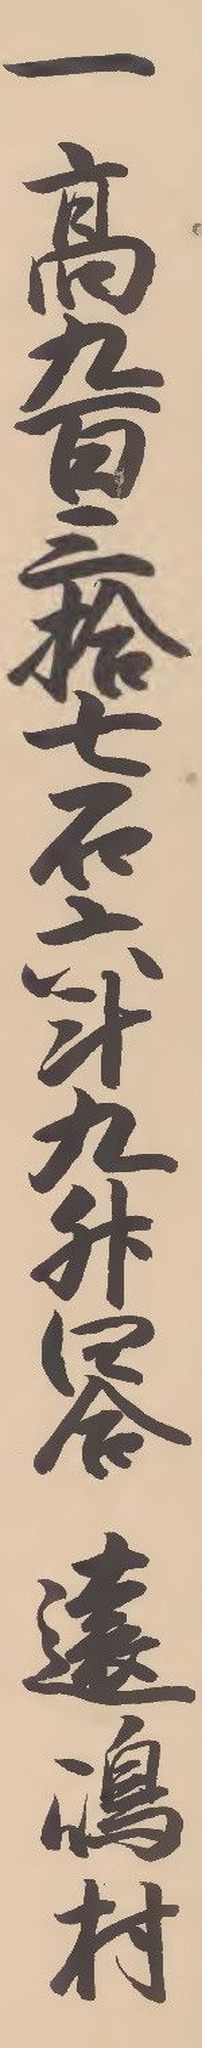一高九百三拾七石六斗九升四合遠島村
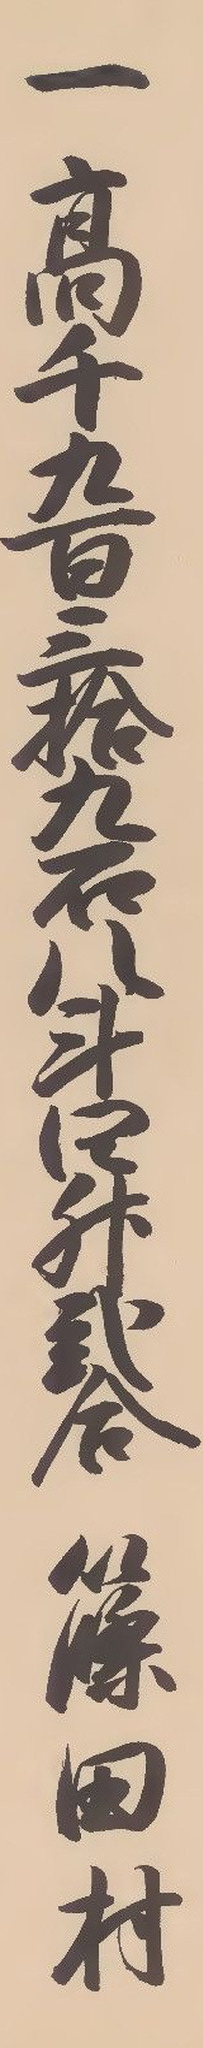一高千九百三拾九石八斗四升弐合篠田村
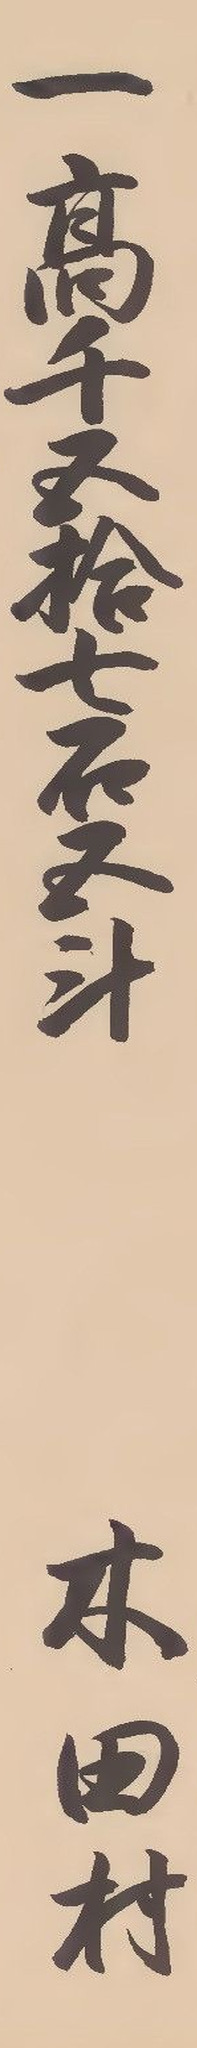一高千五拾七石五斗木田村
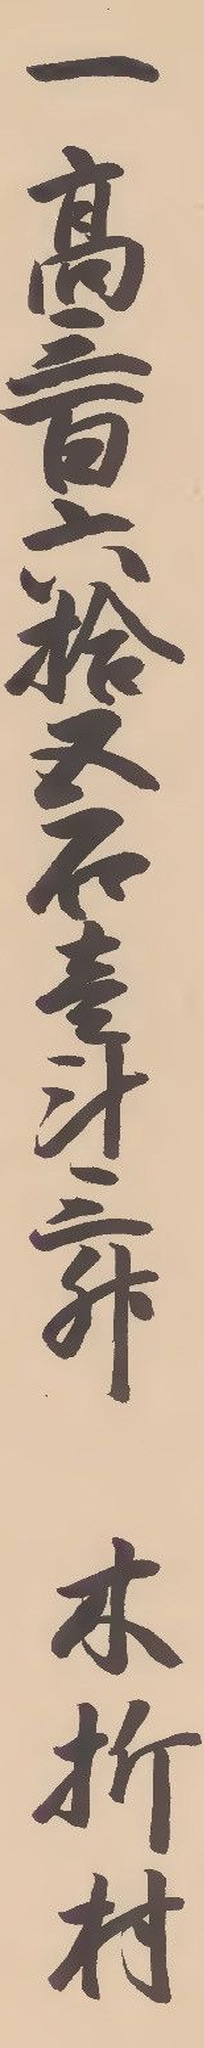一高三百六拾五石壱斗三升木折村

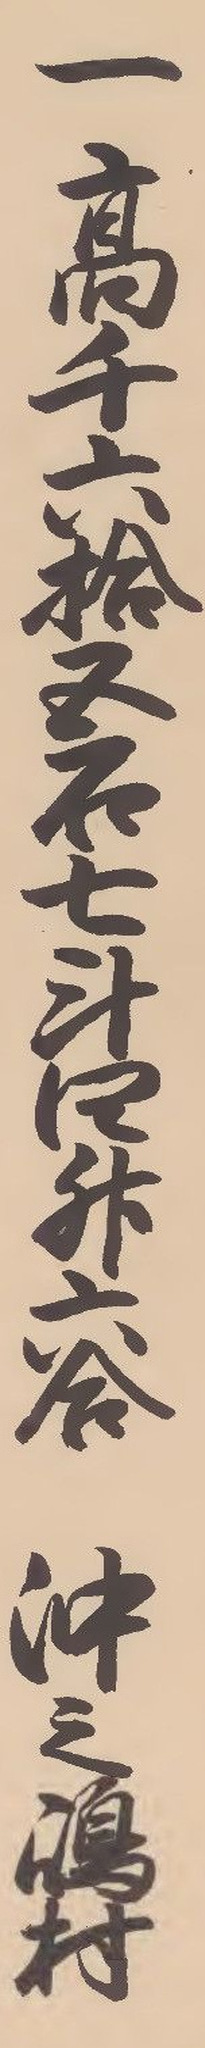一高千六拾五石七斗四升六合沖之島村
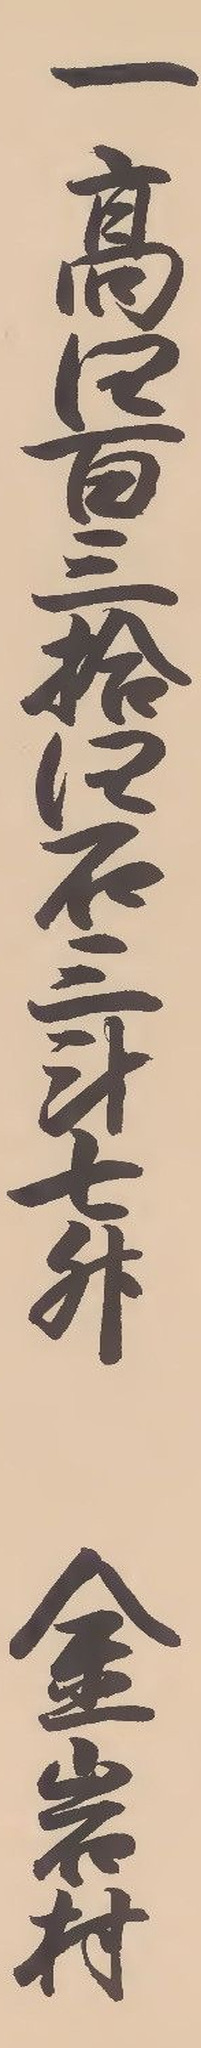一高四百三拾四石三斗七升金岩村
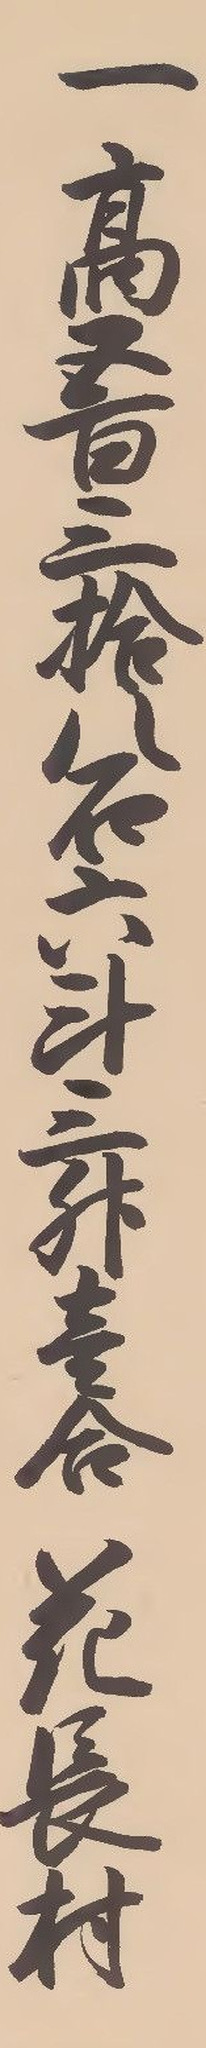一高五百三拾八石六斗三升壱合花長村
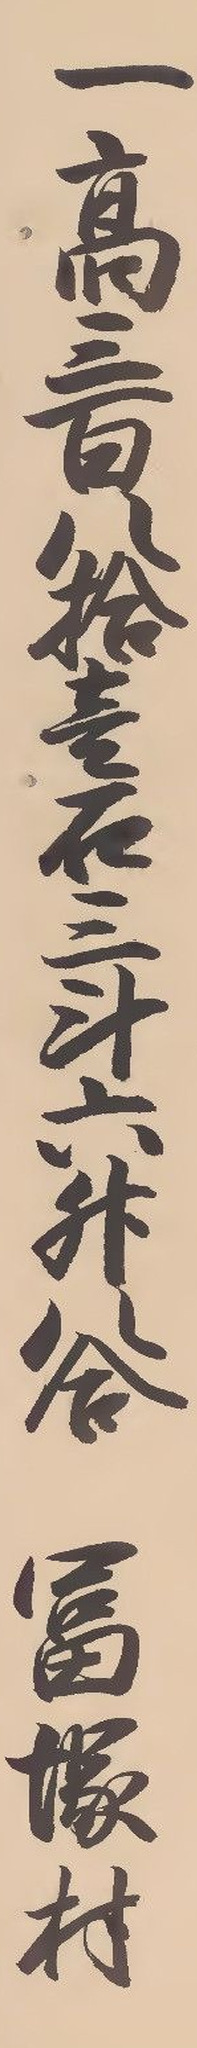一高三百八拾壱石三斗六升八合富塚村
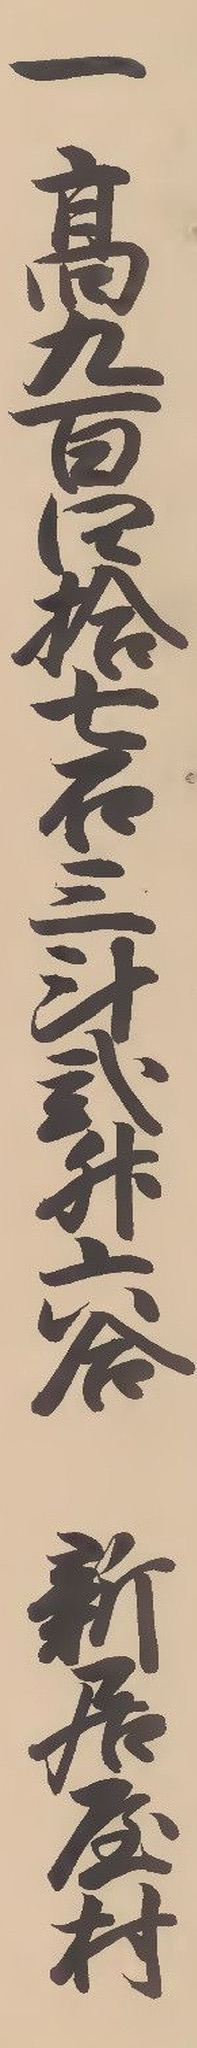一高九百四拾七石三斗弐升六合新居屋村
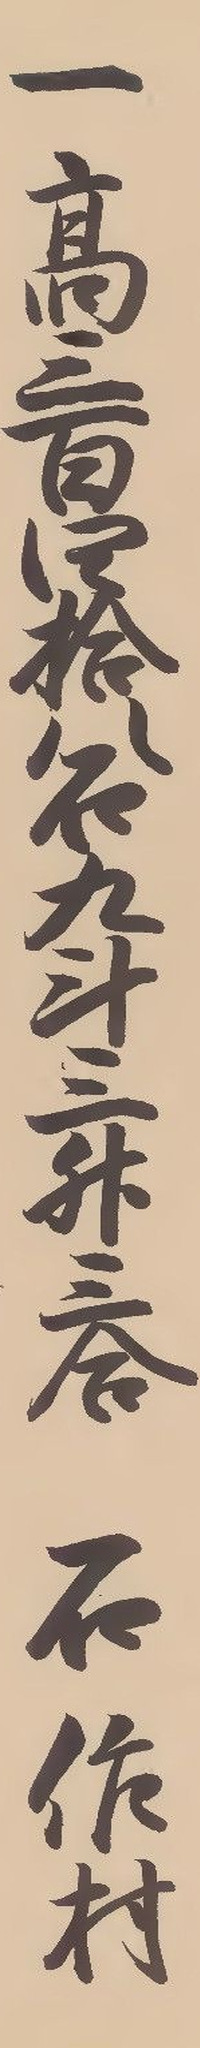一高三百四拾八石九斗三升三合石作村
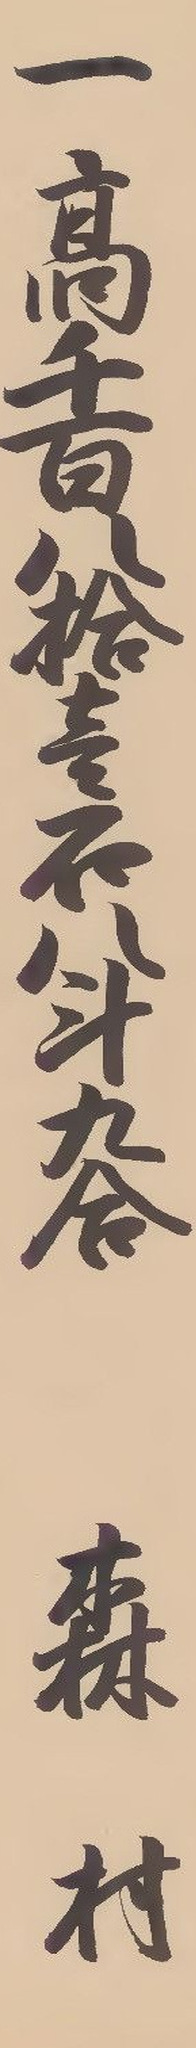一高千百八拾壱石八斗九合森村

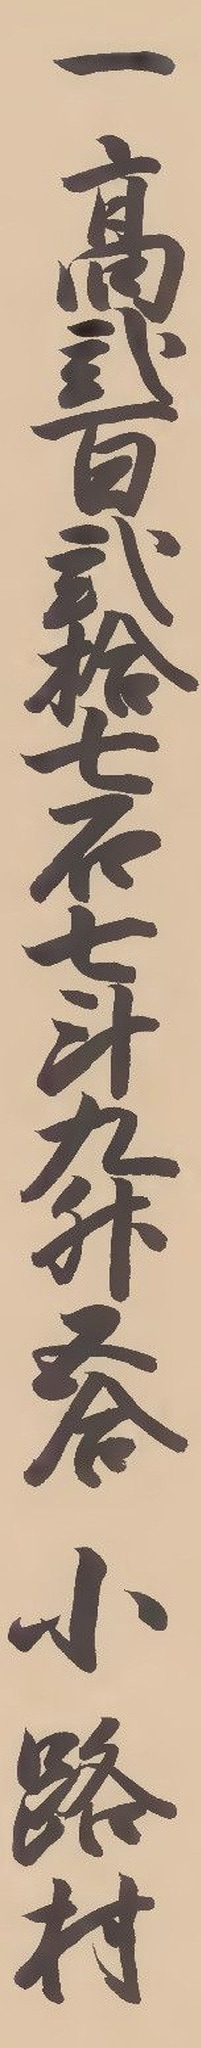一高弐百弐拾七石七斗九升五合小路村
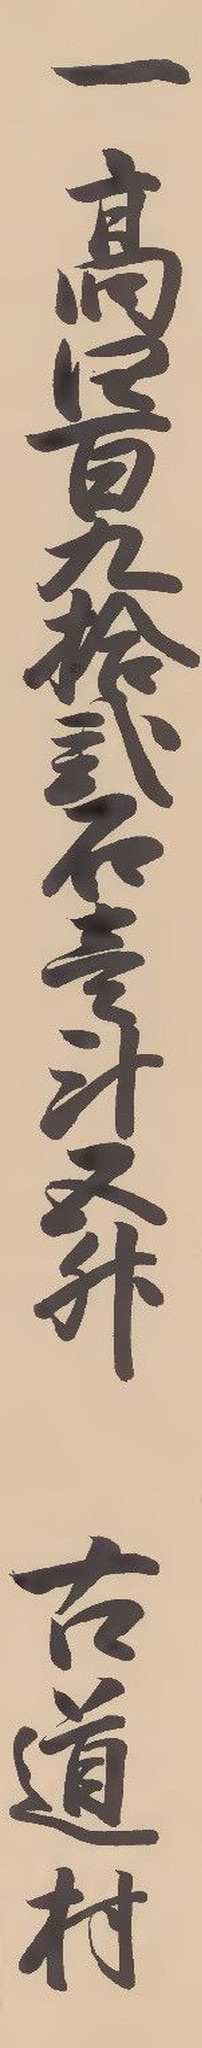一高四百九拾弐石壱斗五升古道村
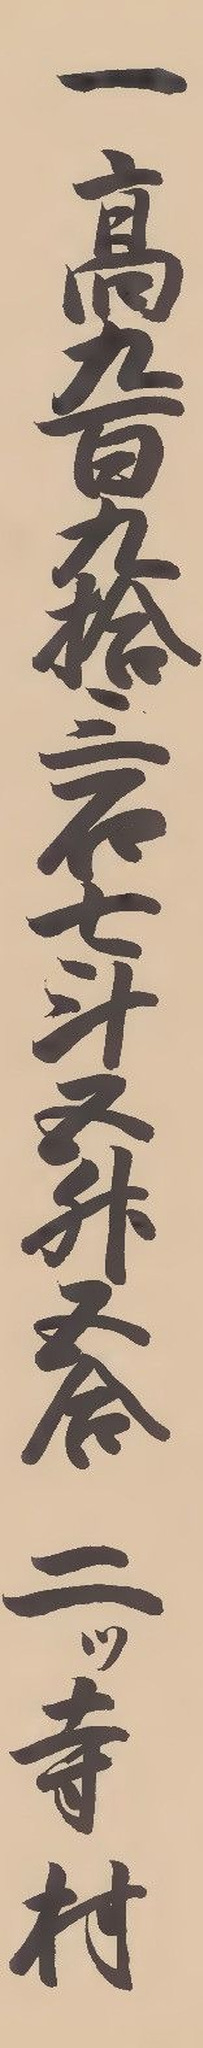一高九百九拾三石七斗五升五合二ツ寺村
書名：尾張国郷帳
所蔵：国立公文書館 National Archives of Japan
